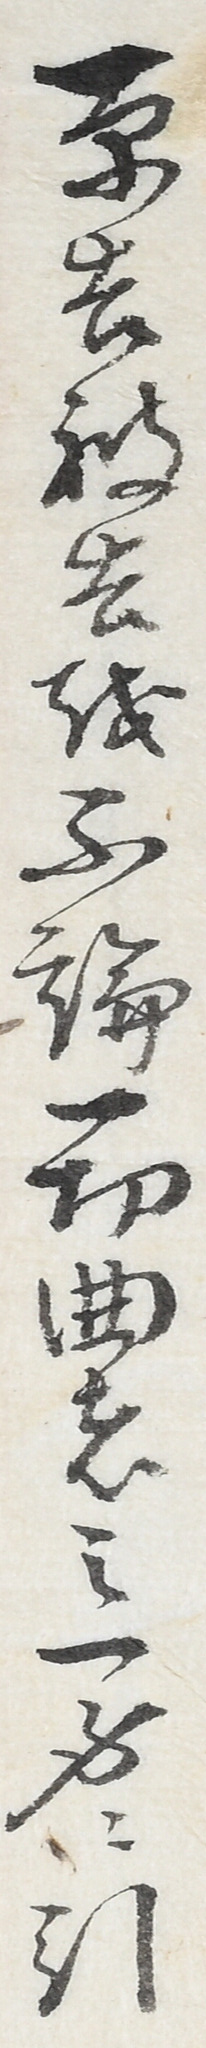原告被告を不論一切曲者之一身ニ引
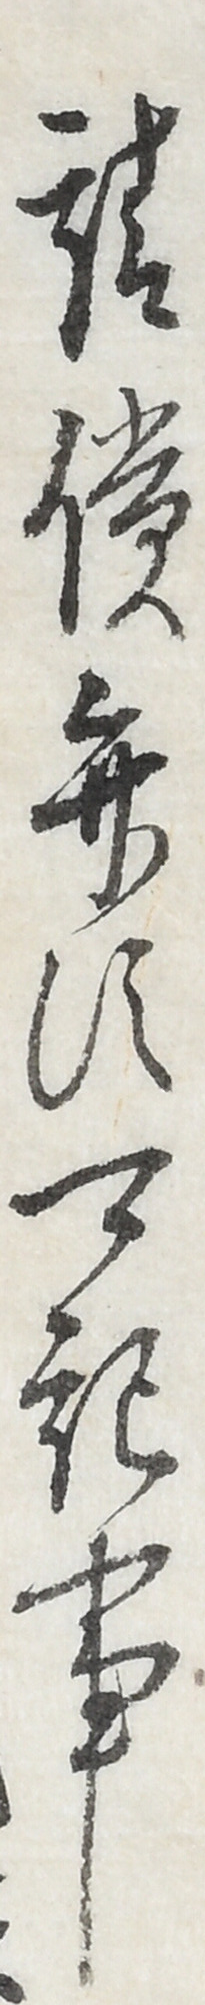請償弁す可記事
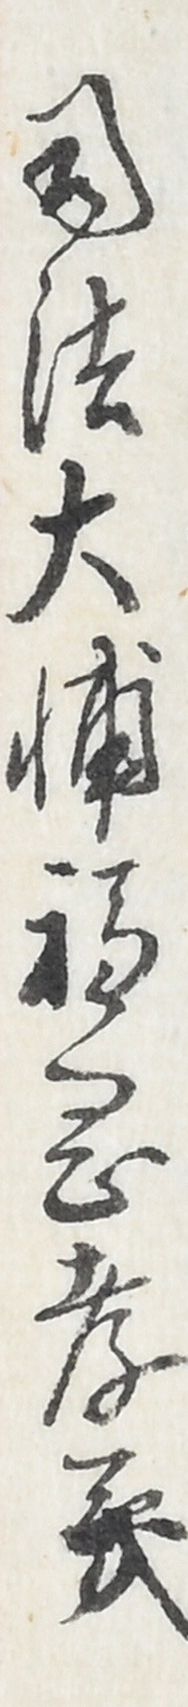司法大輔福岡孝弟

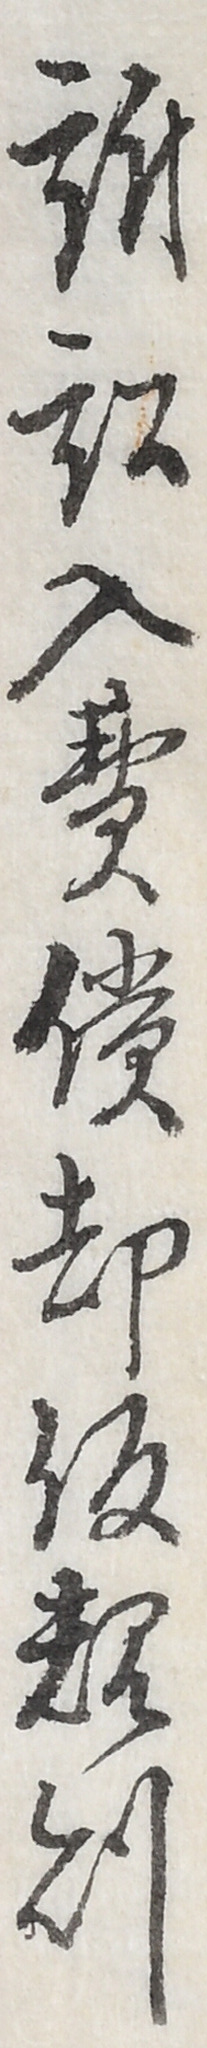訴訟入費償却仮規則
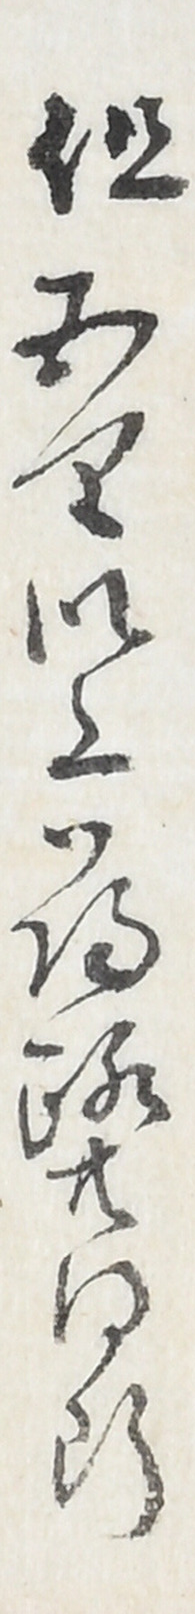但五里以上御帰路共同断
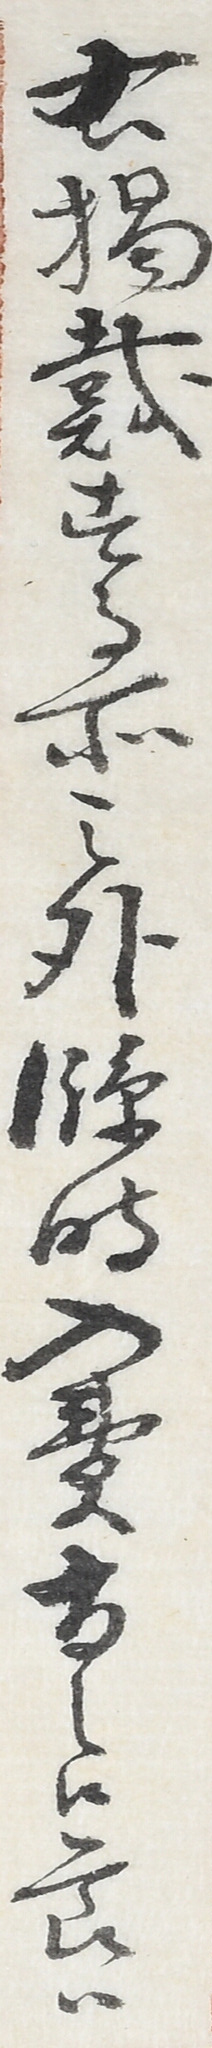右掲載する所之外臨時入費有之候節ハ
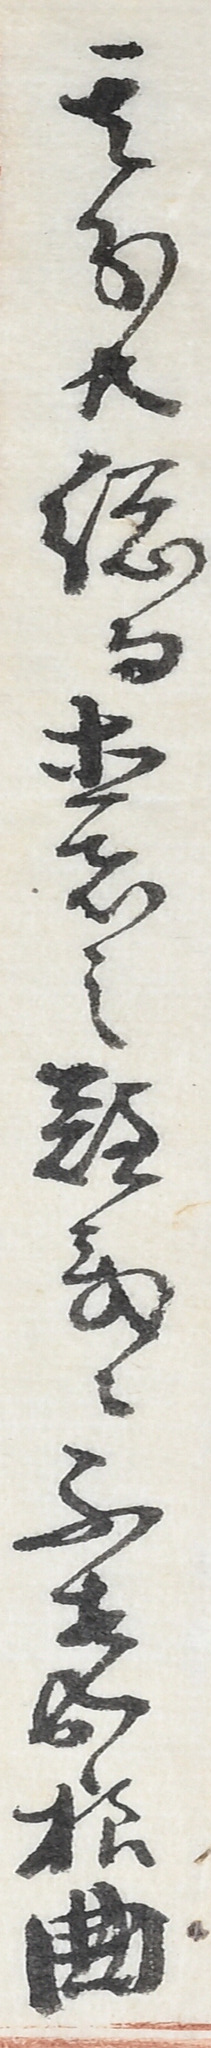其分共総而直者之難義ニ不相成候様曲

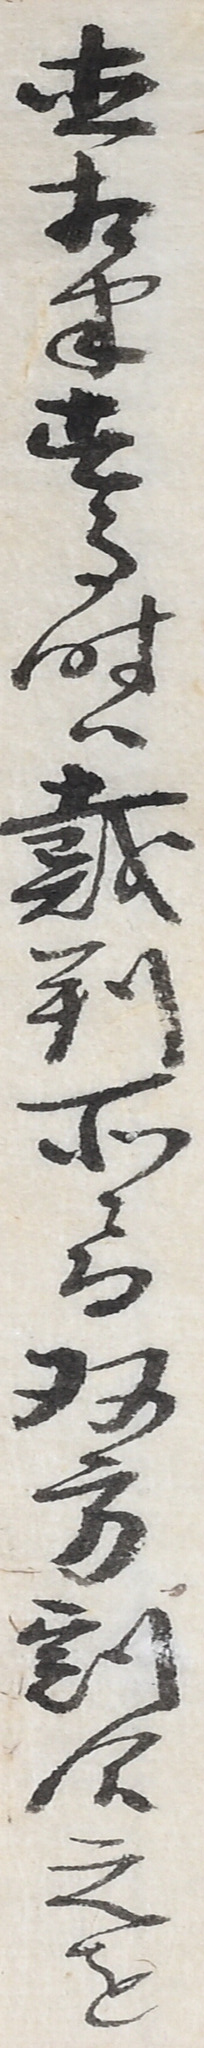直相半する時は裁判所ニ而双方割合之を
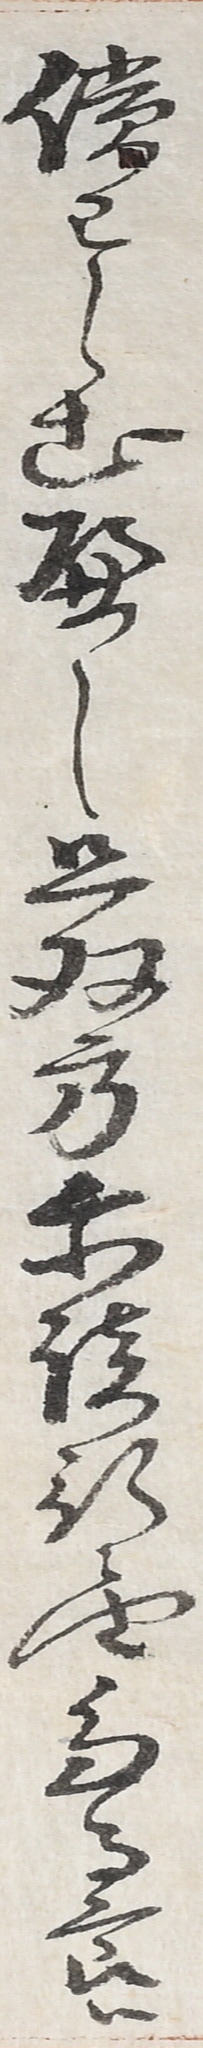償わしむへし只双方示談行届たる節は
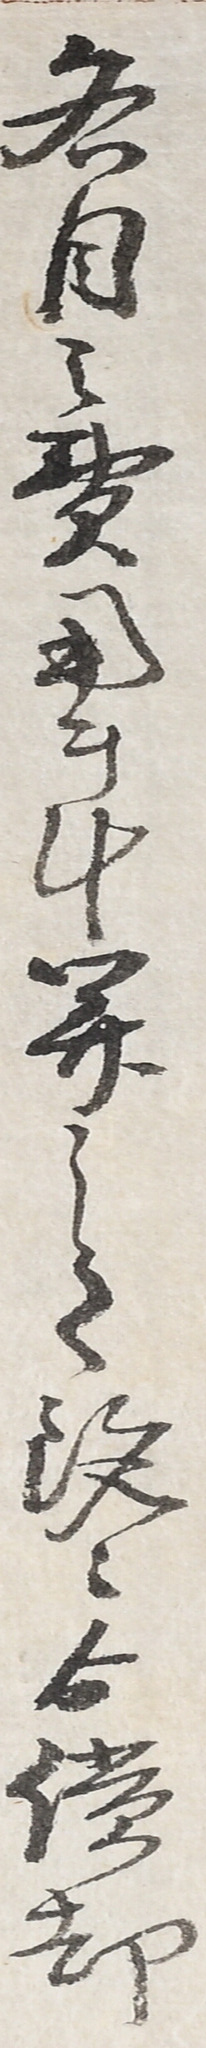各自之費用ヲ計算して銘々より償却
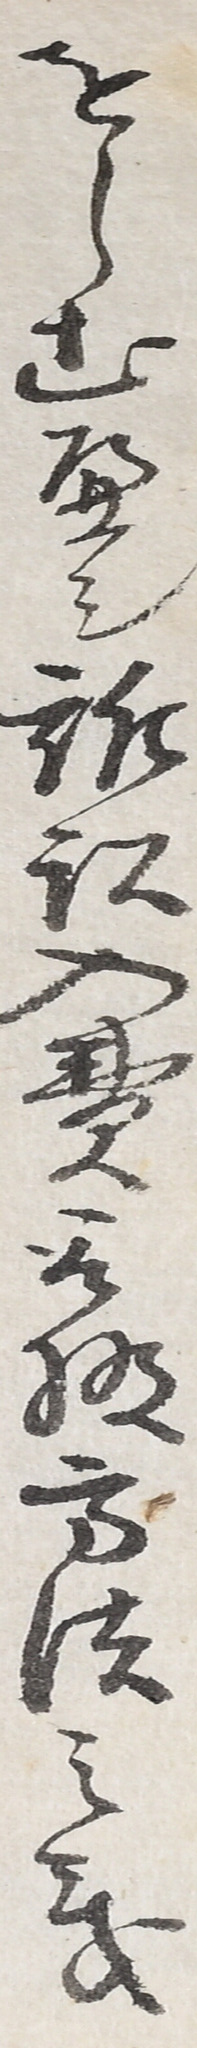せしむへし訴訟入費取極方法之義
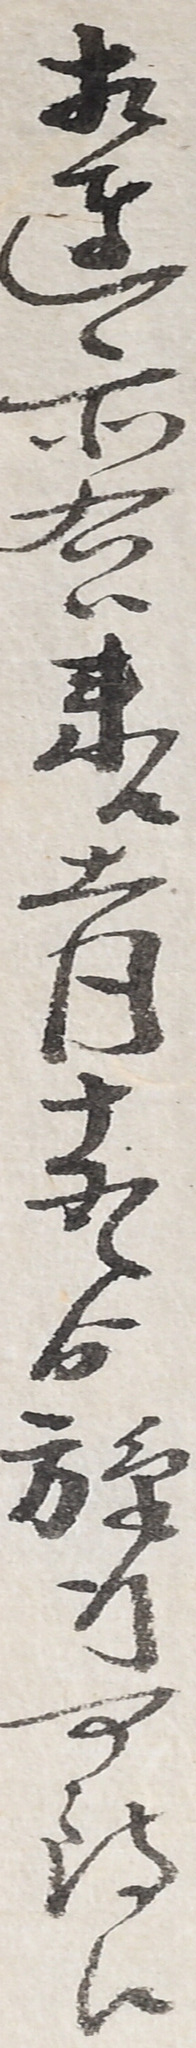相達候所右ハ来ル十一月十五日より施行可致候
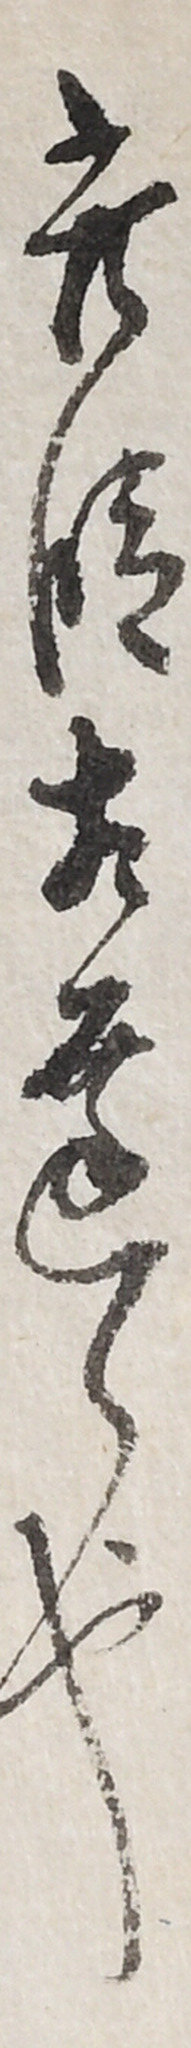此段相達候也
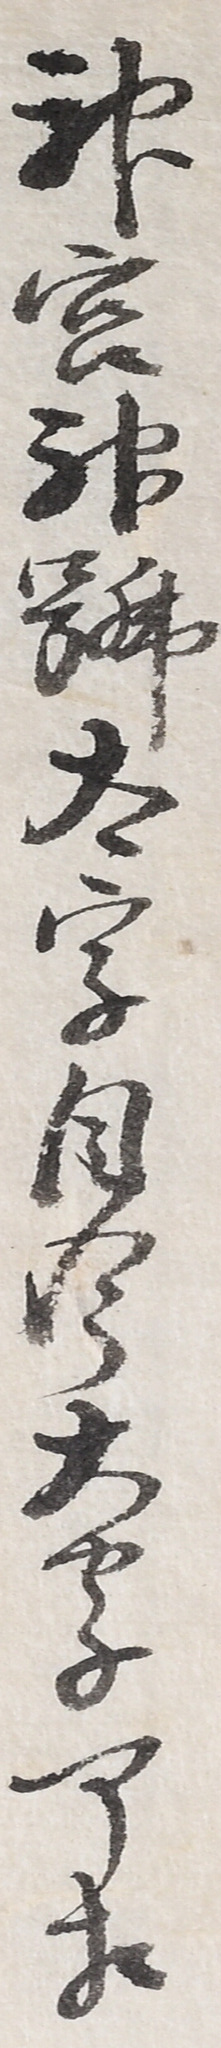神宮神号太字自今大字可相
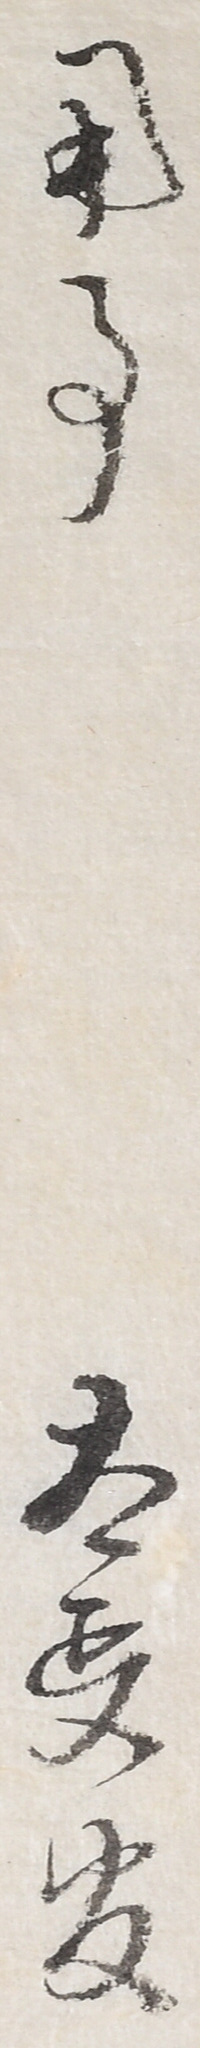用事太政官
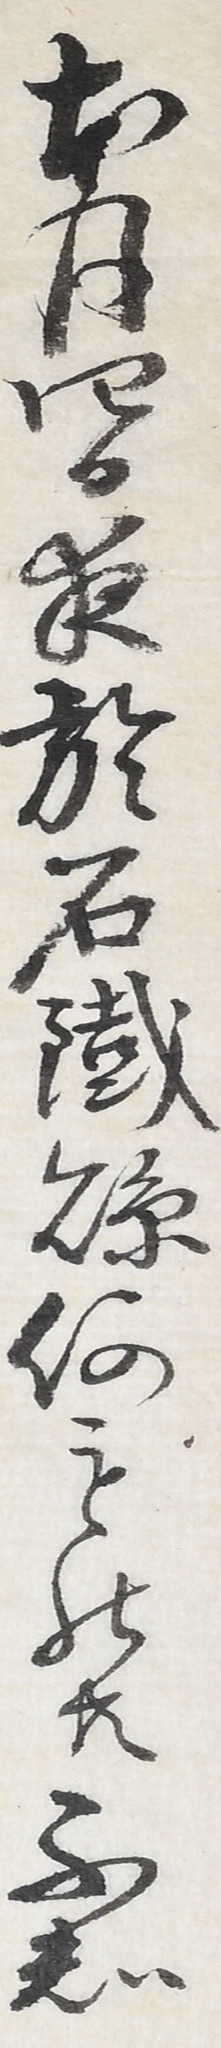本日四日夜於石鉄県何もの共不知
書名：壹番・御布告一式
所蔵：伊那市立高遠町図書館・合同会社AMANE
